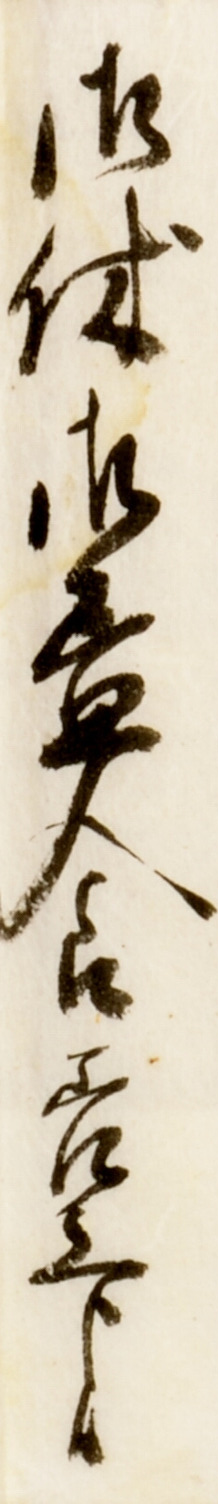御休御昼食差上申候
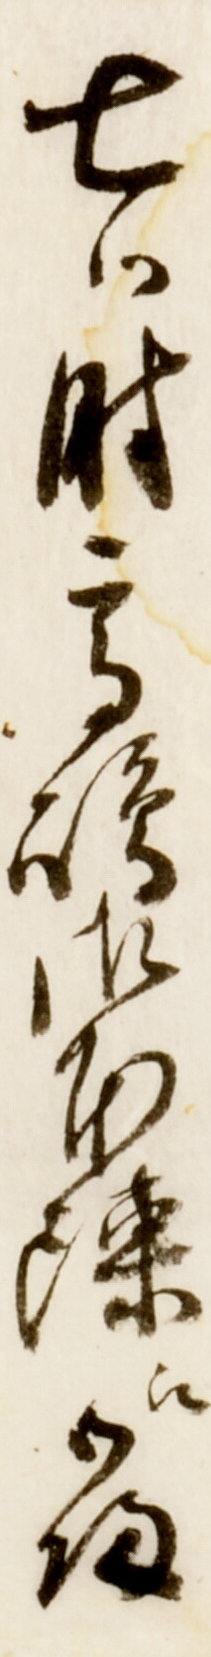七ツ時高嶋御本陣江御帰
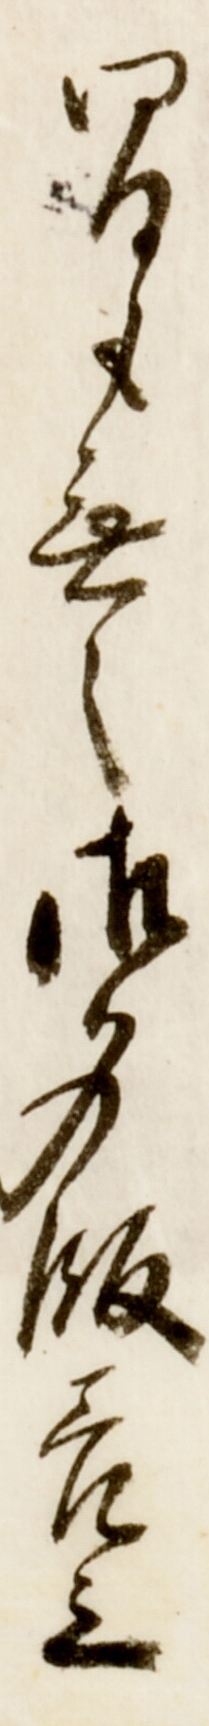間も無之御夕飯差上
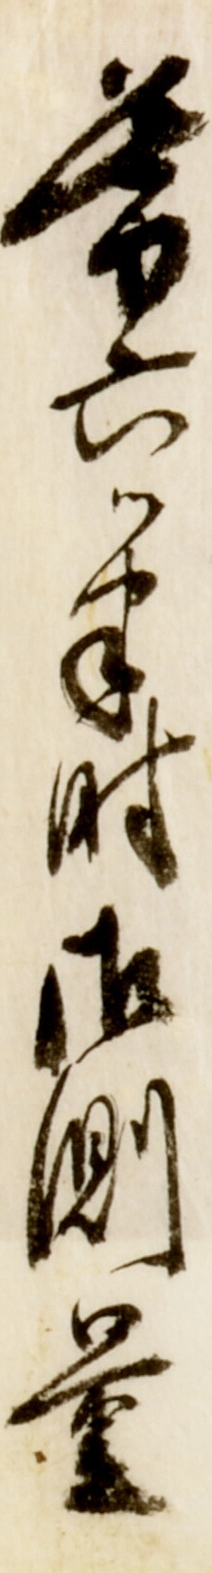暮六ツ半時御測量
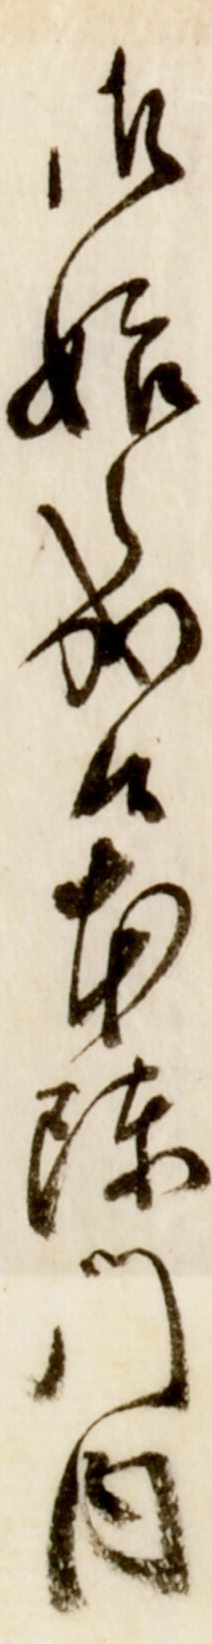御始被成候本陣門内
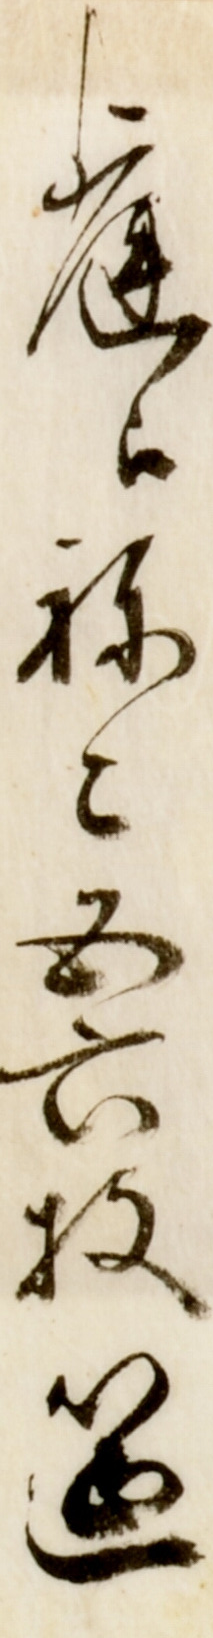庭江ねこ五六枚筵
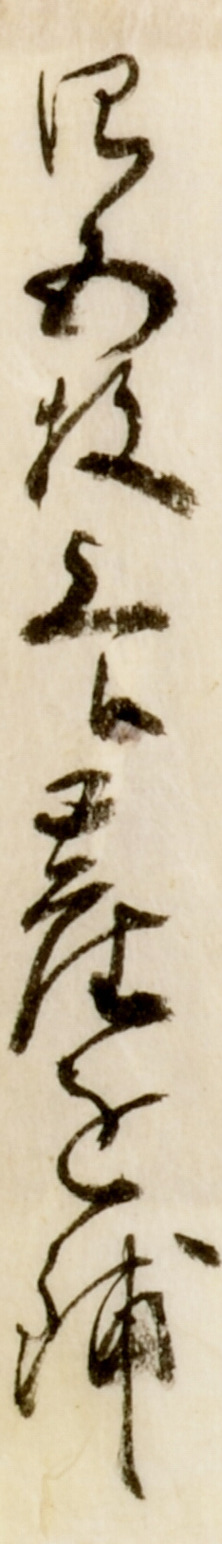四五枚上江蓙を鋪

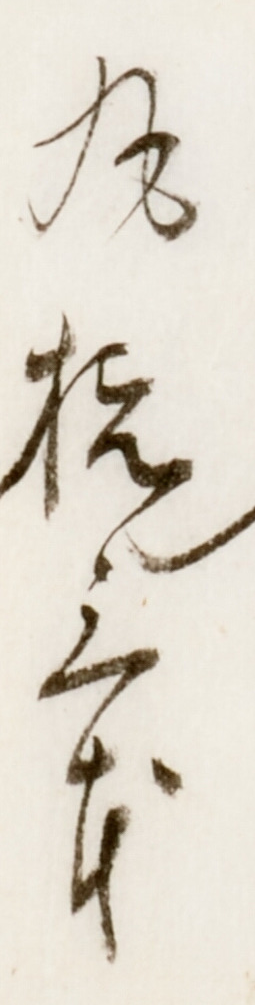丸杭三本
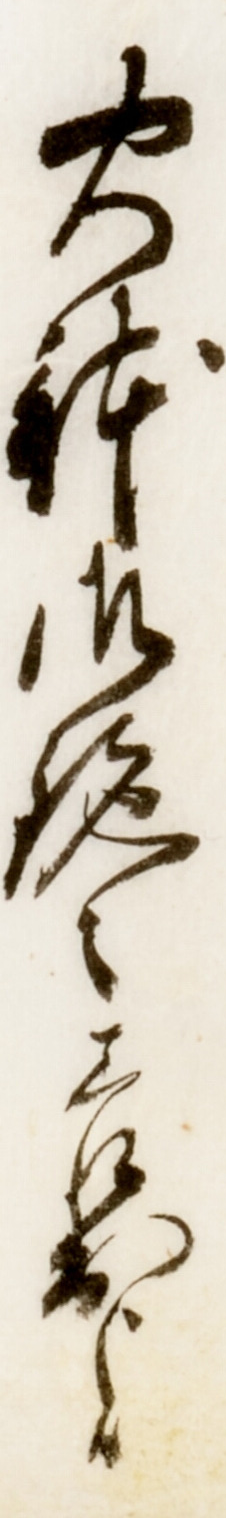火鉢御銘々差出申候
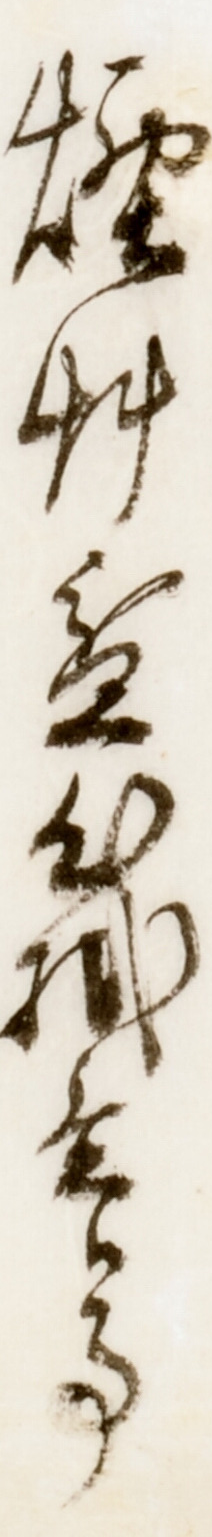煙草盆心掛置候事
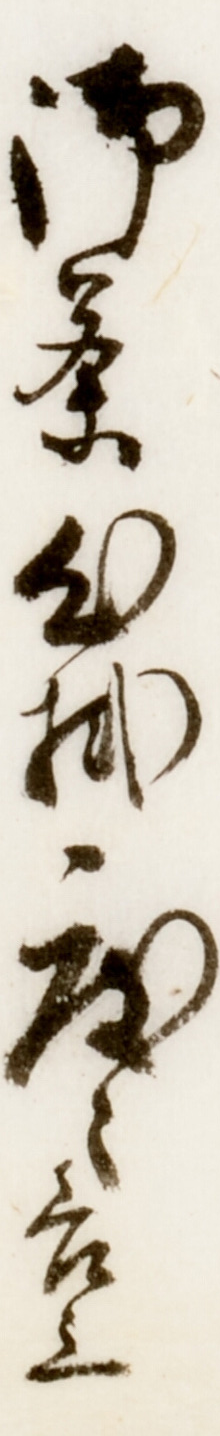御茶心掛、度々差上
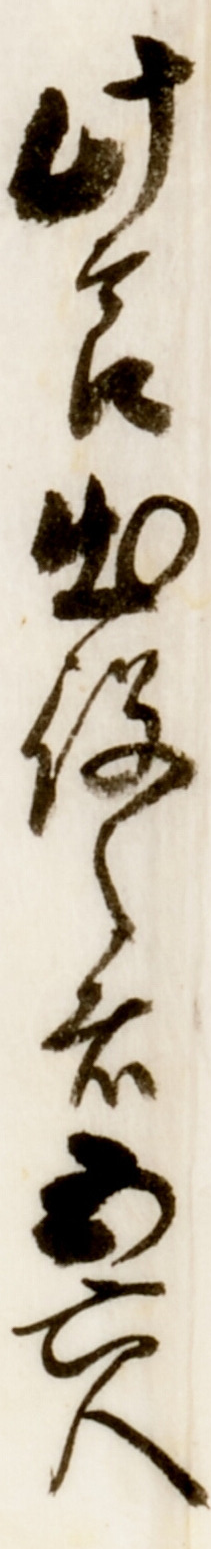此節出役之者、五六人
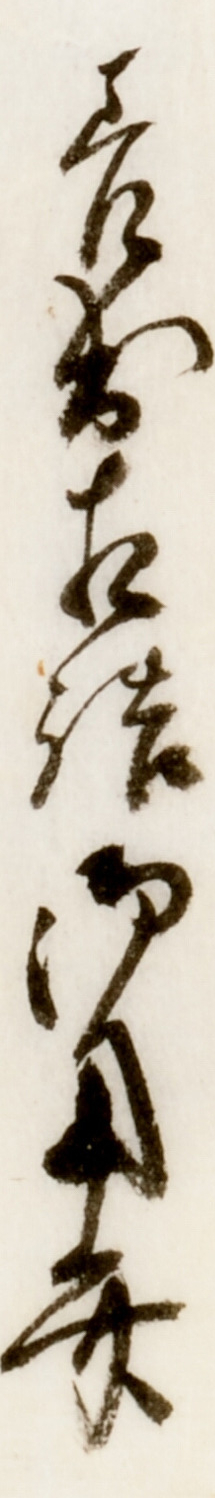差出相詰御用弁
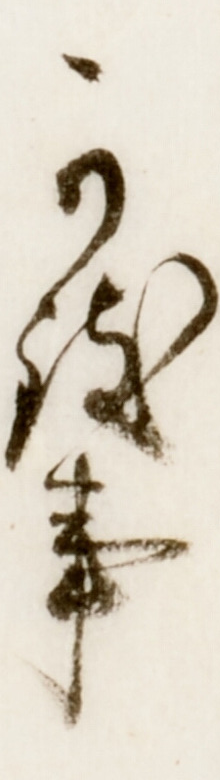可致事
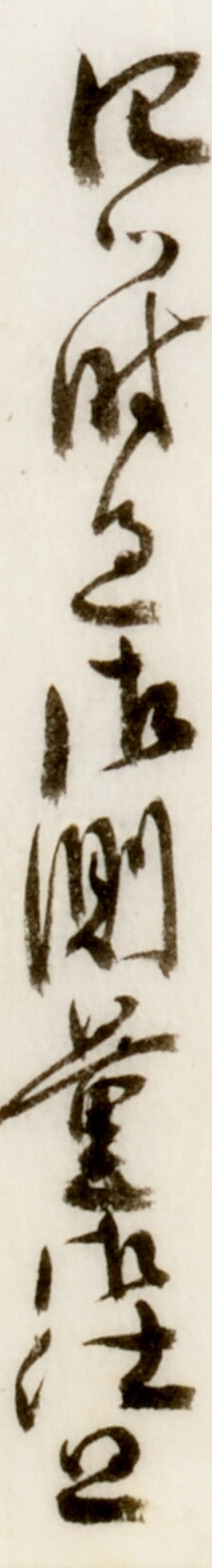四ツ時過、御測量御仕立
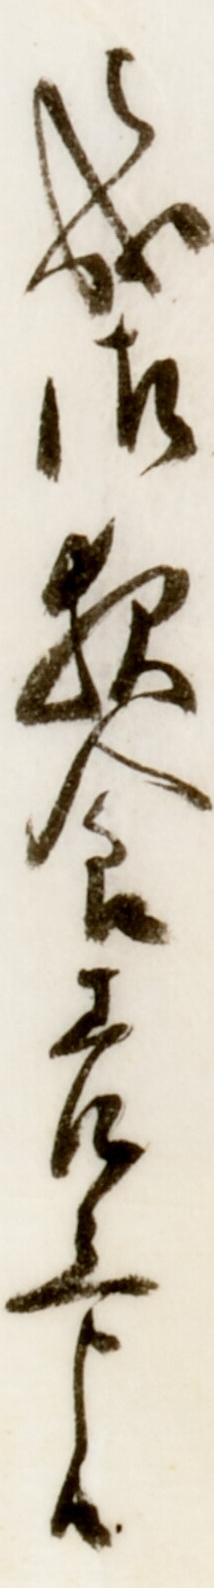被成御夜食差上申候、
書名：覚
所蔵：伊那市立高遠町図書館・合同会社AMANE
